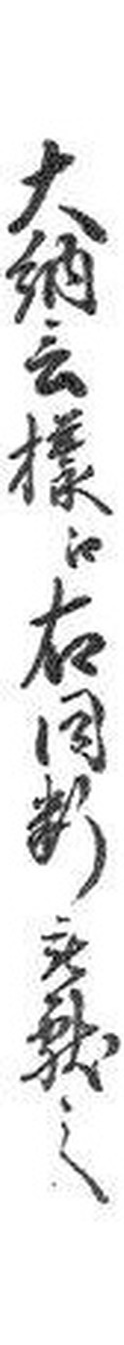大納言様江右同断被献之
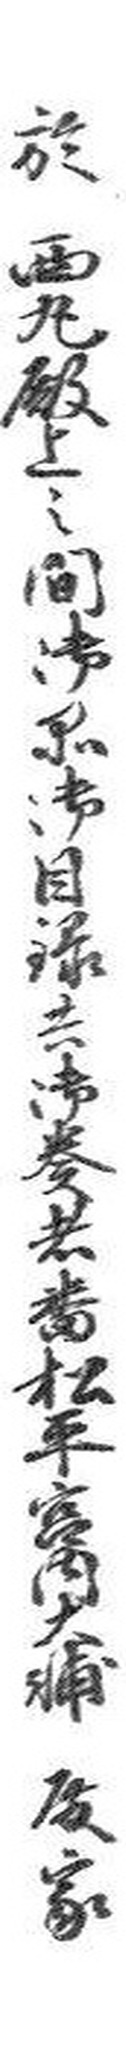於西丸殿上之間御品御目録共御奏者番松平宮内大輔殿家
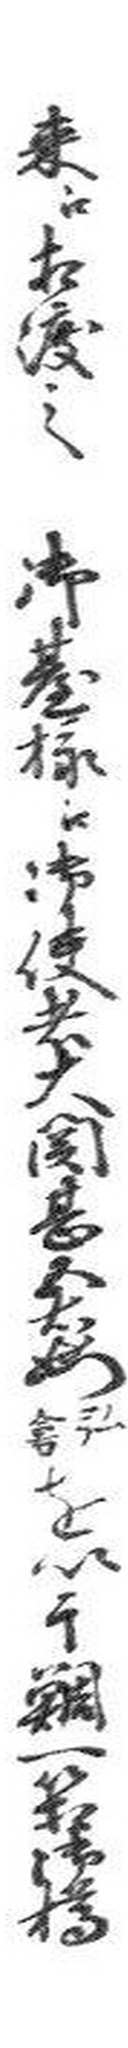来江相渡之御台様江御使者大関甚五右衛門弘倉を以干鯛一箱御樽
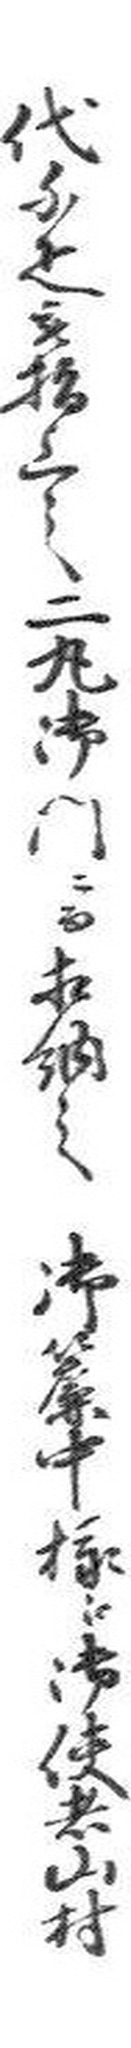代千疋被指出之二丸御門ニ而相納之御簾中様江御使者山村
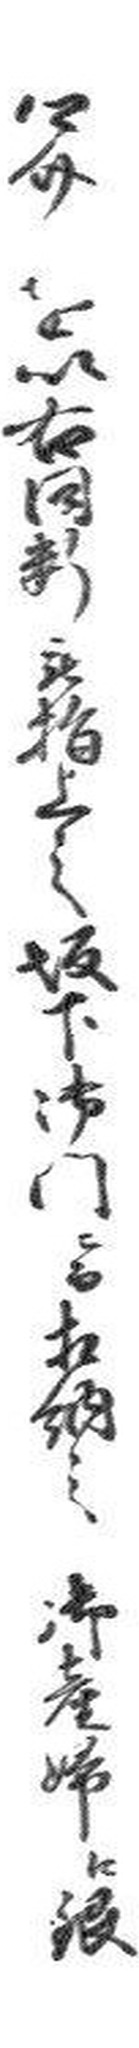郷介を以右同断被指上之坂下御門ニ而相納之御産婦江銀
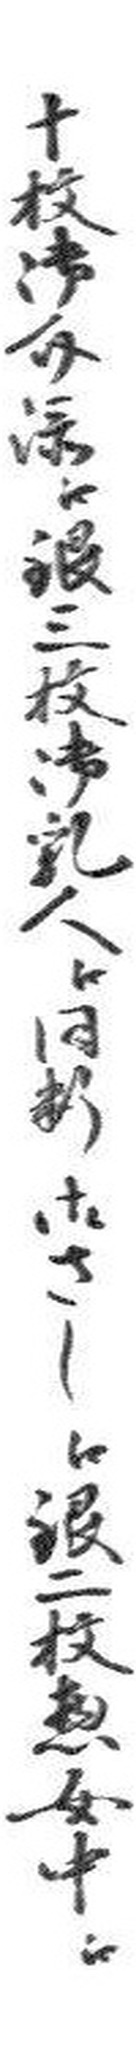十枚御介添江銀三枚御乳人江同断御さし江銀二枚惣女中江
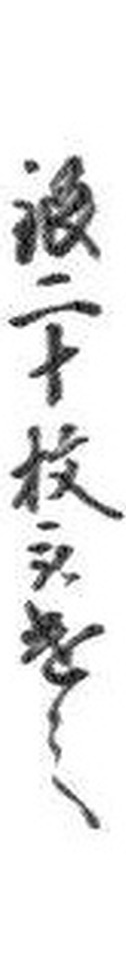銀二十枚被遣之
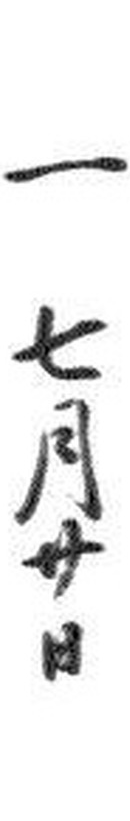一七月廿日
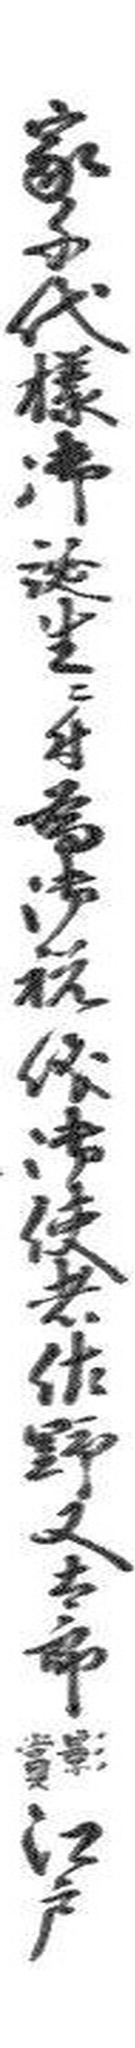家千代様御誕生ニ付為御祝儀御使者佐野又太郎影賞江戸
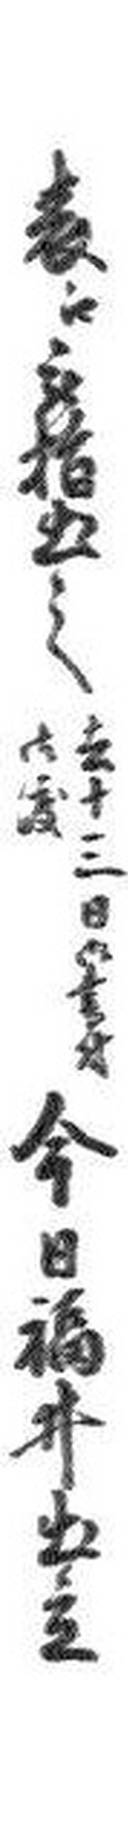表江被指出之去十三日御書付御渡今日福井出立
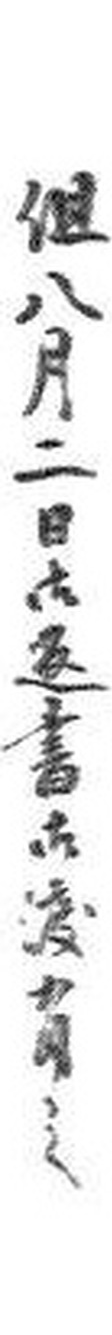但八月二日御返書御渡有之
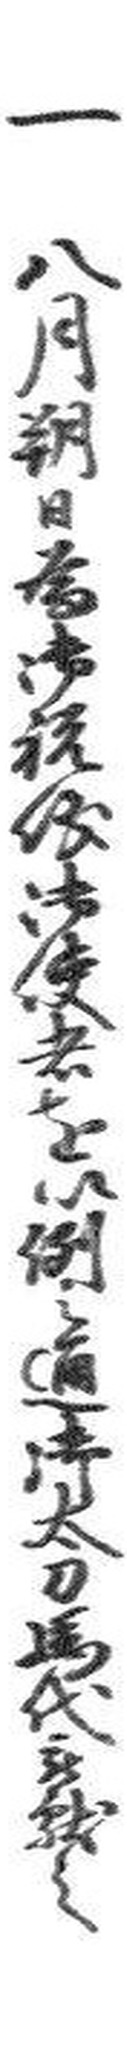一八月朔日為御祝儀御使者を以例之通御太刀馬代被献之
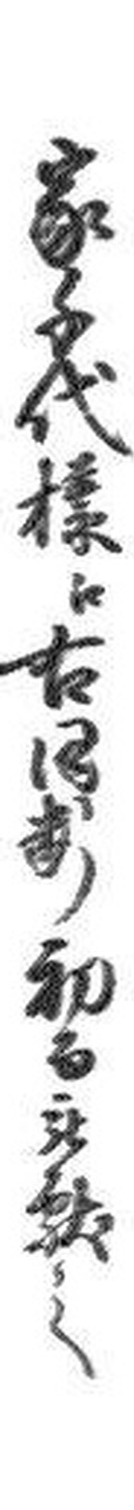家千代様江右同断初而被献之
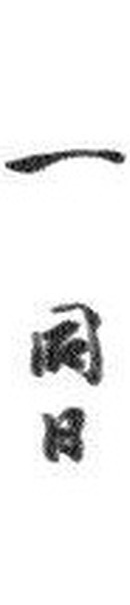一同日
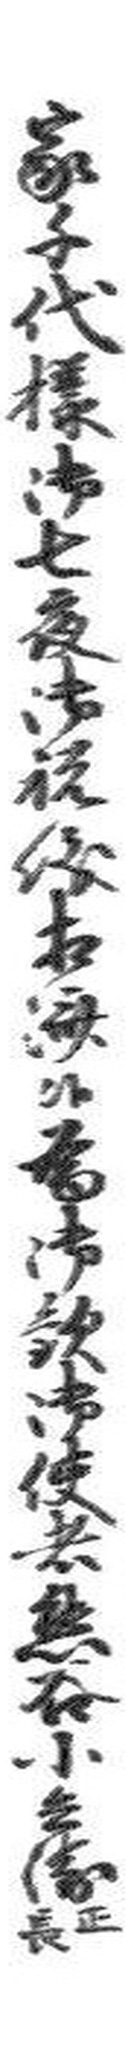家千代様御七夜御祝儀相済候為御歓御使者熊谷小兵衛正長

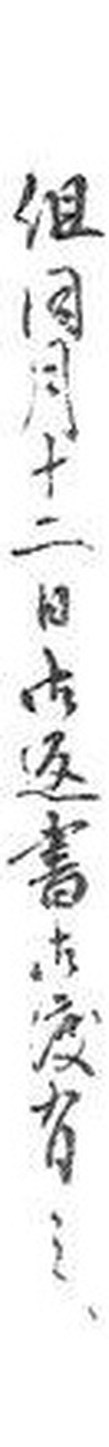但同月十二日御返書御渡有之
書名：家譜 二十四 吉品公 従宝永三年到同五年
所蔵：福井県文書館 Fukui Prefectural Archives
